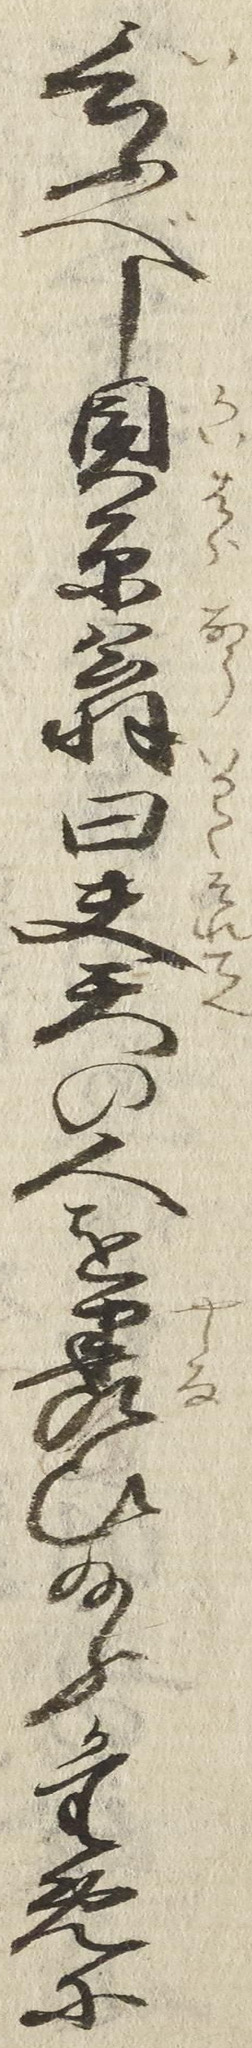言ふべし貝原翁曰夫天の人を養ひ給ふかために
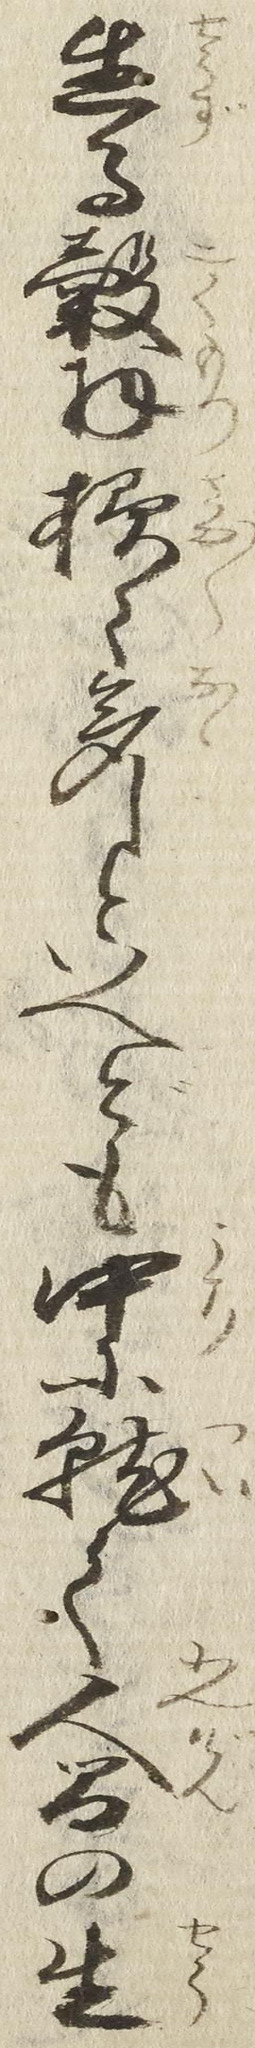生る穀物様〻多しといへとも中に就て人間の生
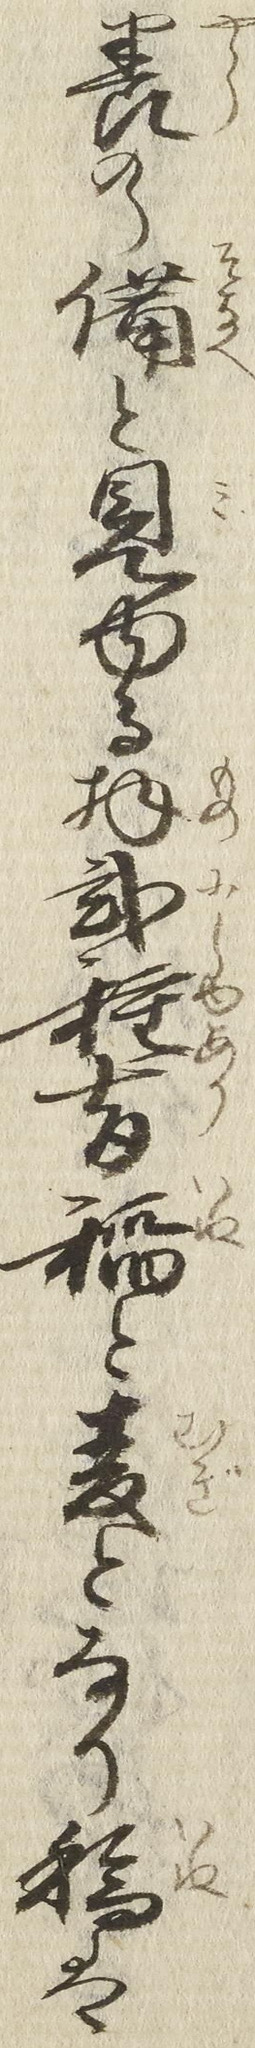養の備と見ゆる物弐種有稲と麦となり稲は
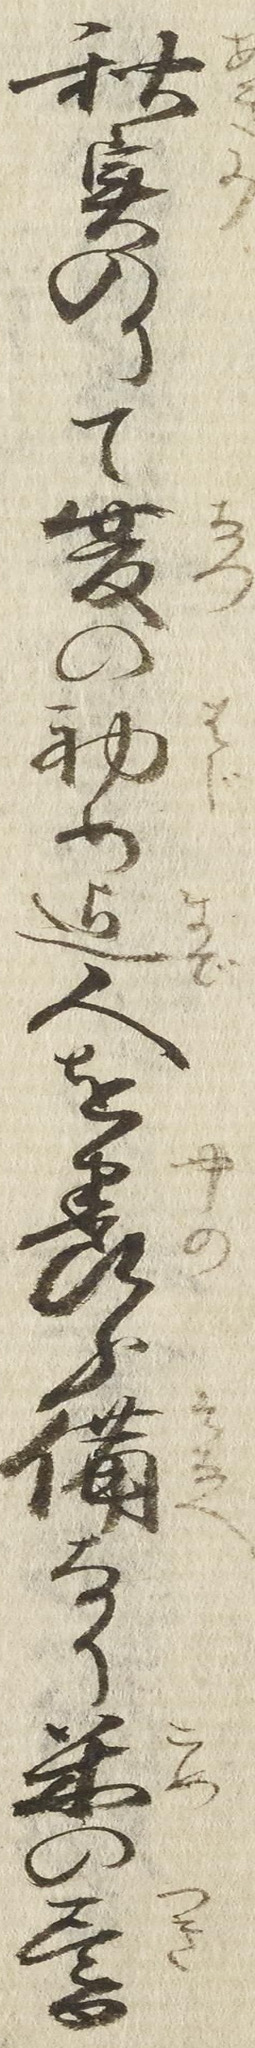秋実のりて夏の初め迄人を養ふ備なり米の尽る
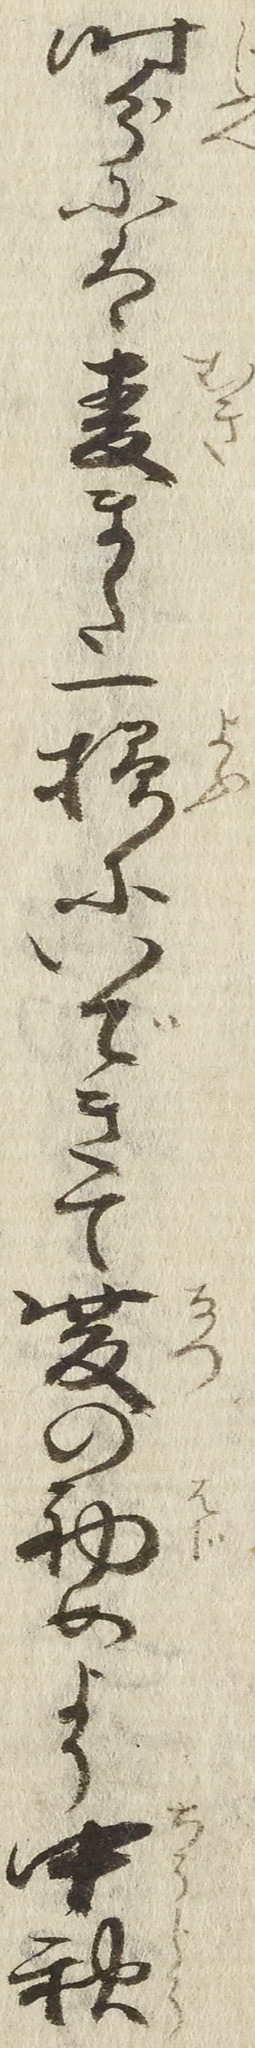時分には麦また一様にいできて夏の初めより中秋
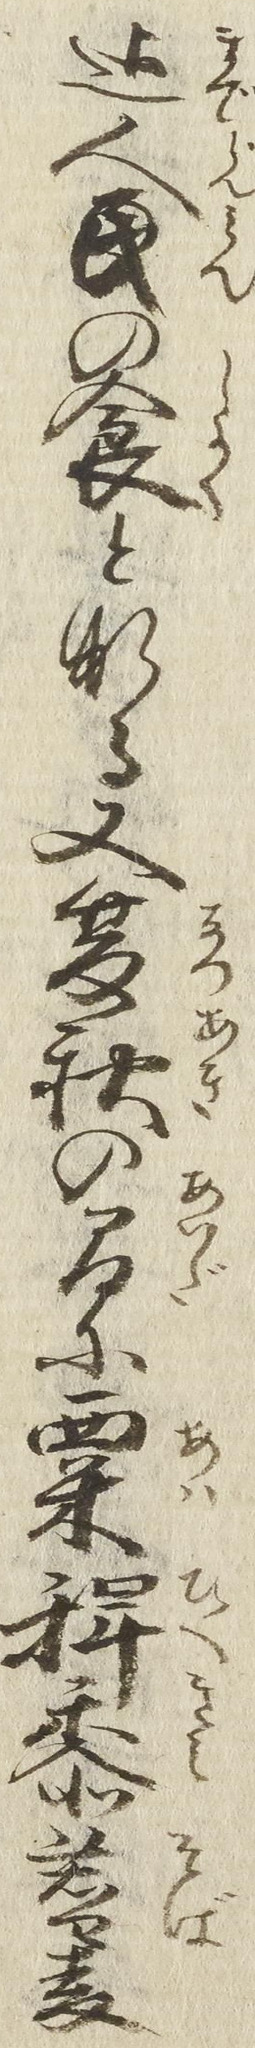迄人民の食となる又夏秋の間に粟稗黍蕎麦
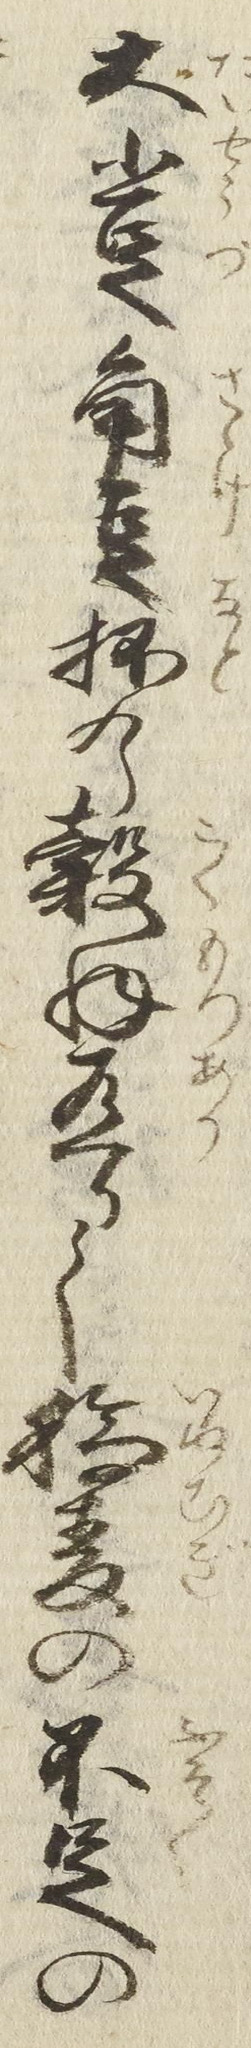大小豆角豆抔の穀物有りて稲麦の不足の
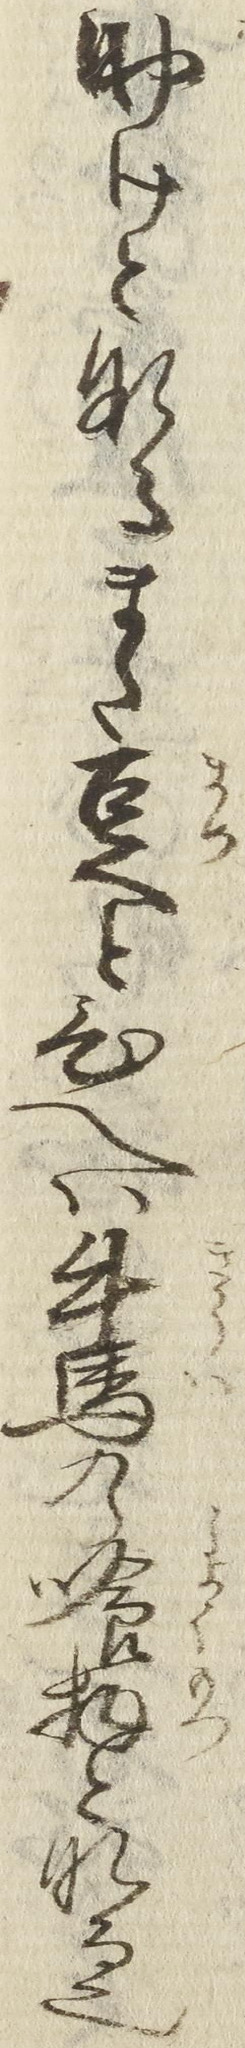助けとなるまた豆とひへは牛馬の喰物となる也
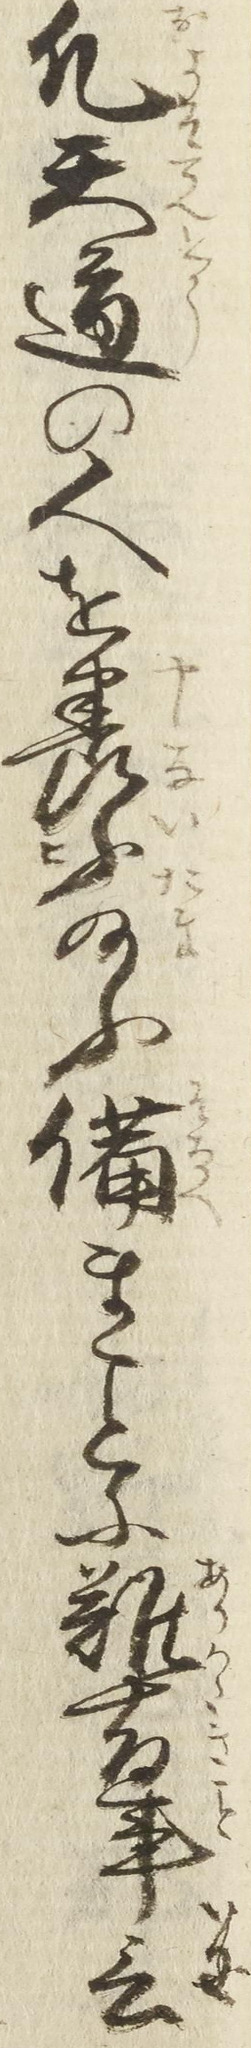凡天道の人を養ふ給ふ備まことに難有事言
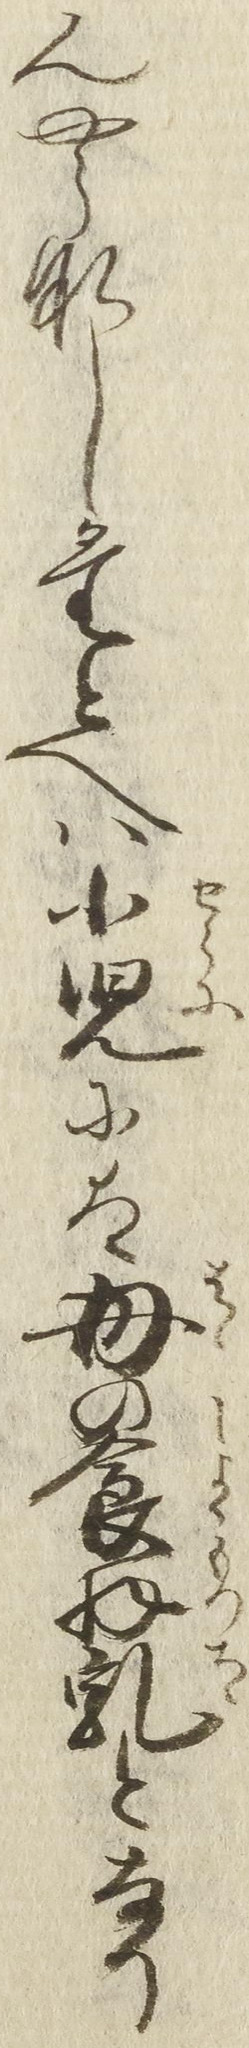んやうなしたとへは小児には母の食物乳となり
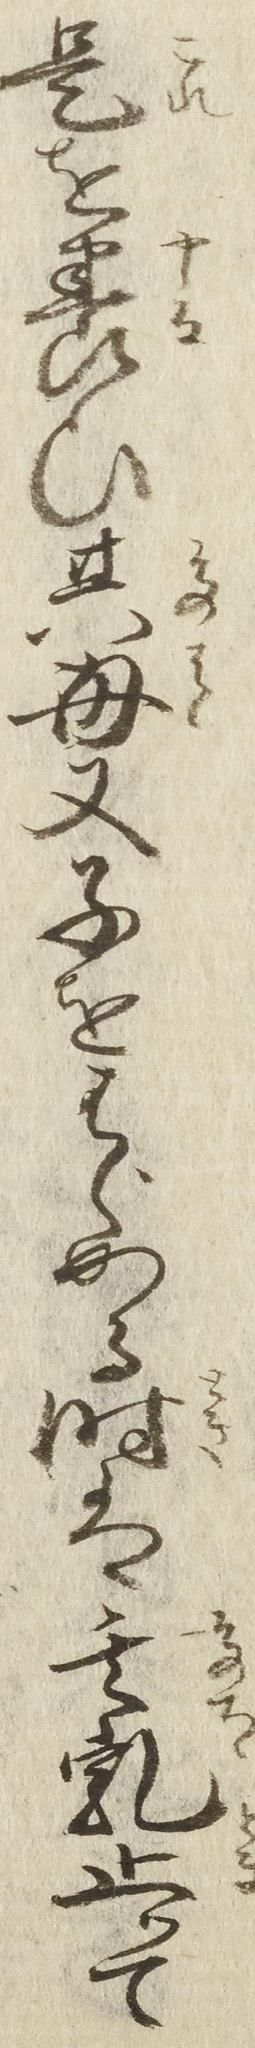是を養ひ其母又子をはらめる時は其乳止ツて
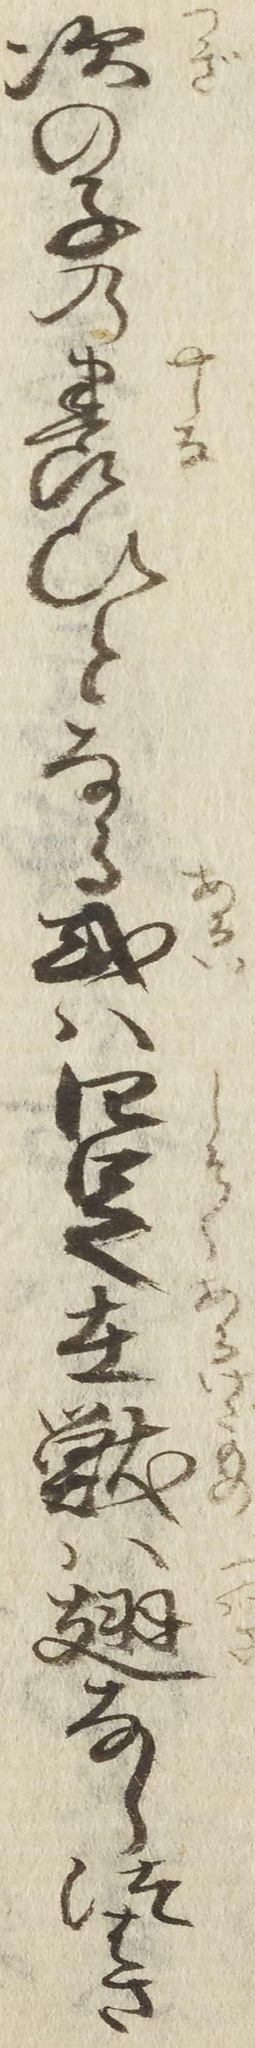次の子の養ひとなる或は四足在獣は翅なしつはさ
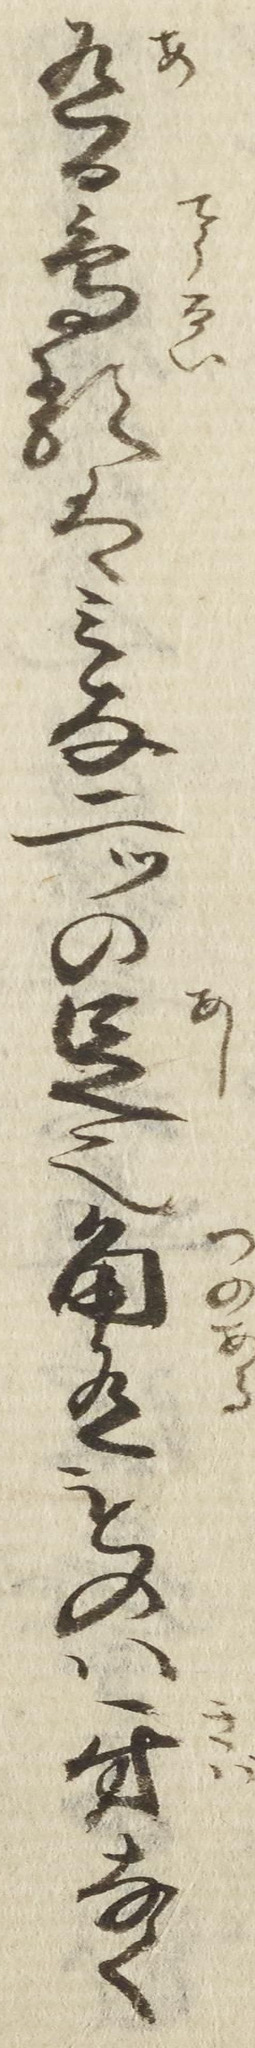有る鳥類はみな二ツ足也角有ものは牙なく
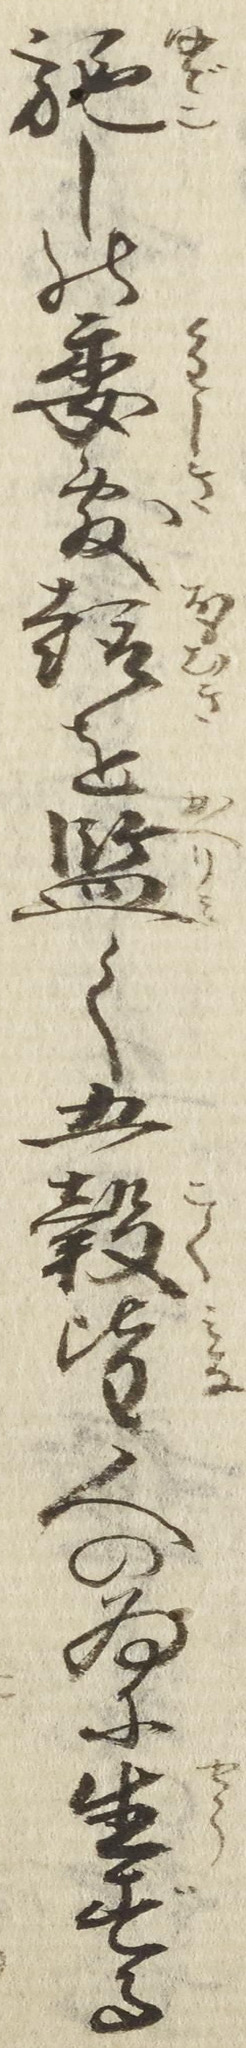施しの委敷趣を監て五穀皆人の為に生ずる
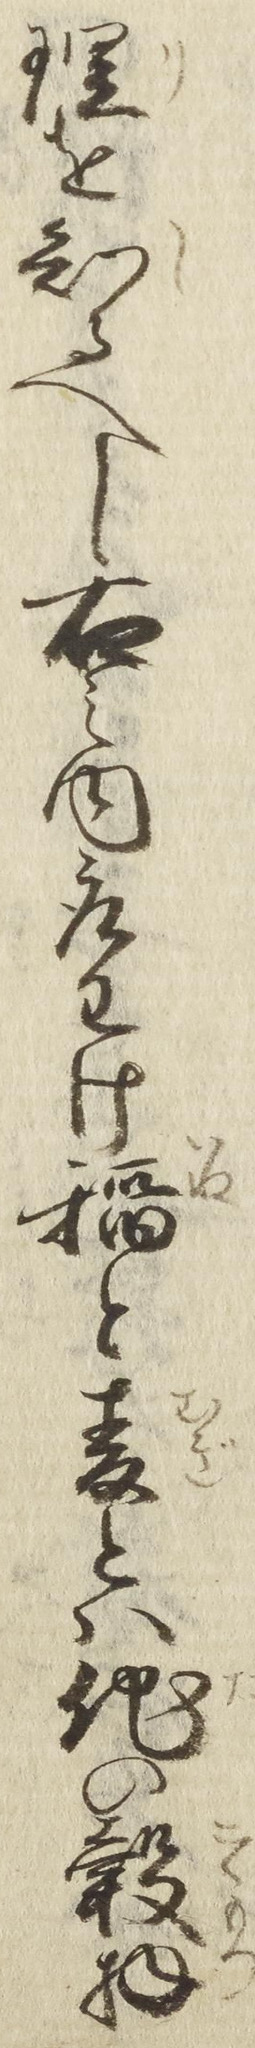理を知るべし右之内取わけ稲と麦とは他の穀物

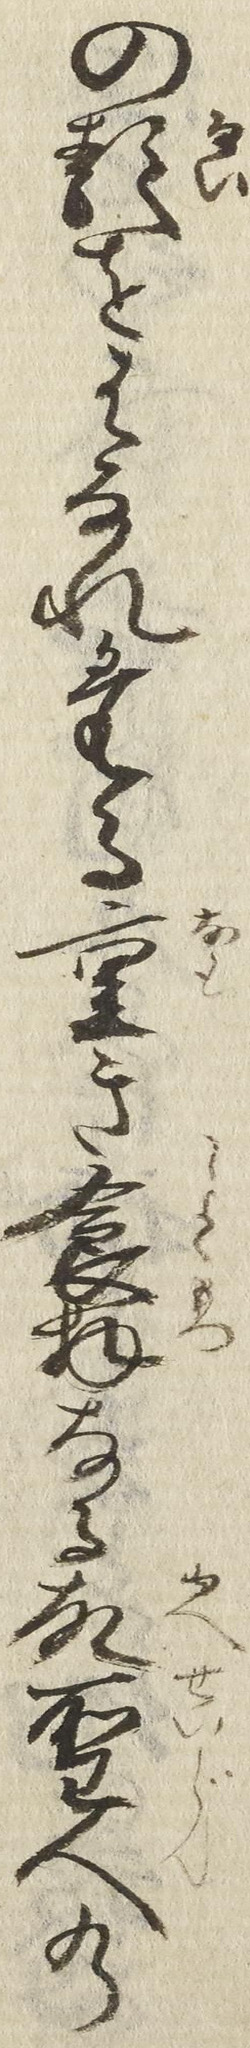の類をはなれたる重き食物なる故聖人の
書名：天明奇畧　全
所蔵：東京大学地震研究所図書室 Earthquake Research Institute Library, The University of Tokyo, JAPAN
